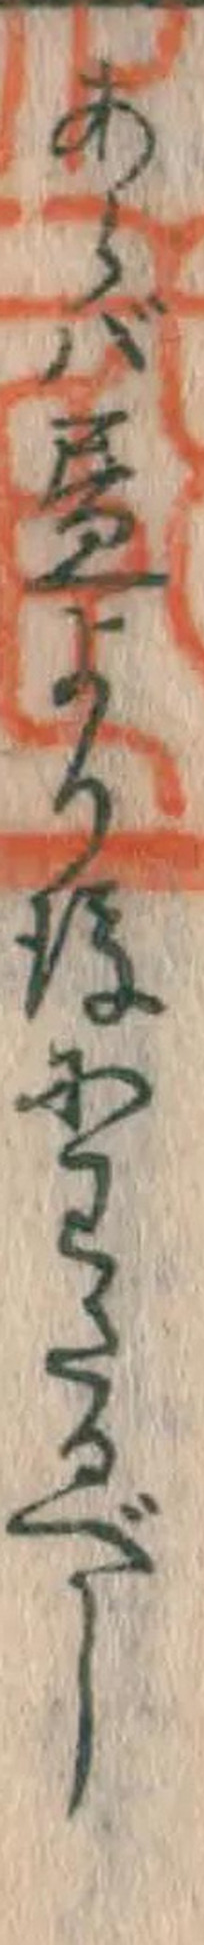あらば昼より後にわたるべし
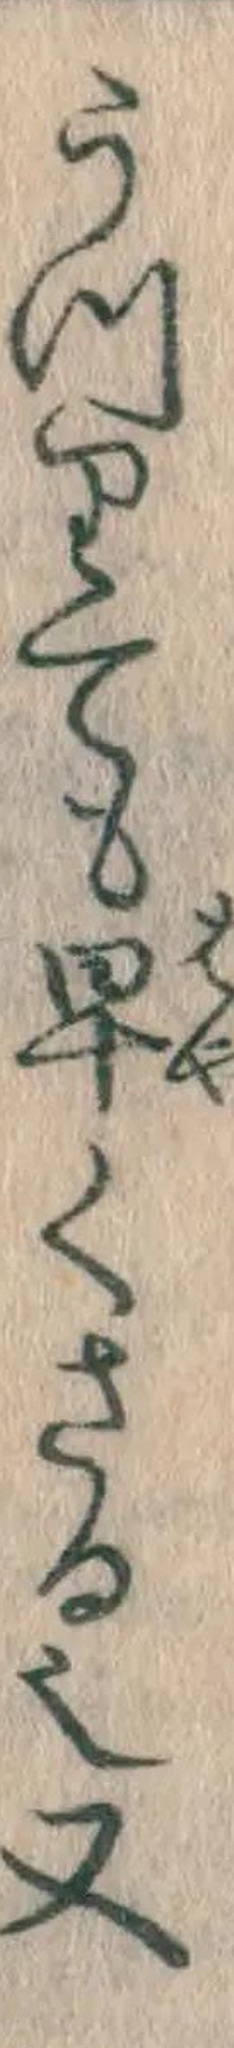うつりても早くさる也又
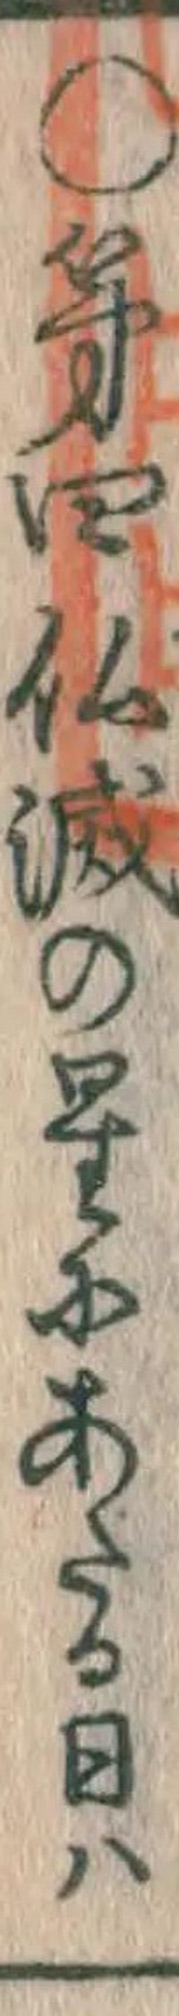○第四仏滅の星にあたる日は
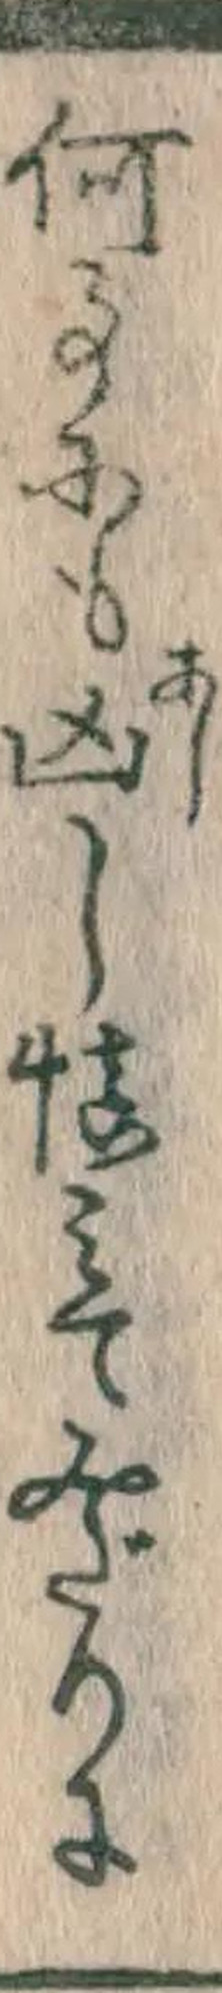何事にも凶し慎みてみだりに
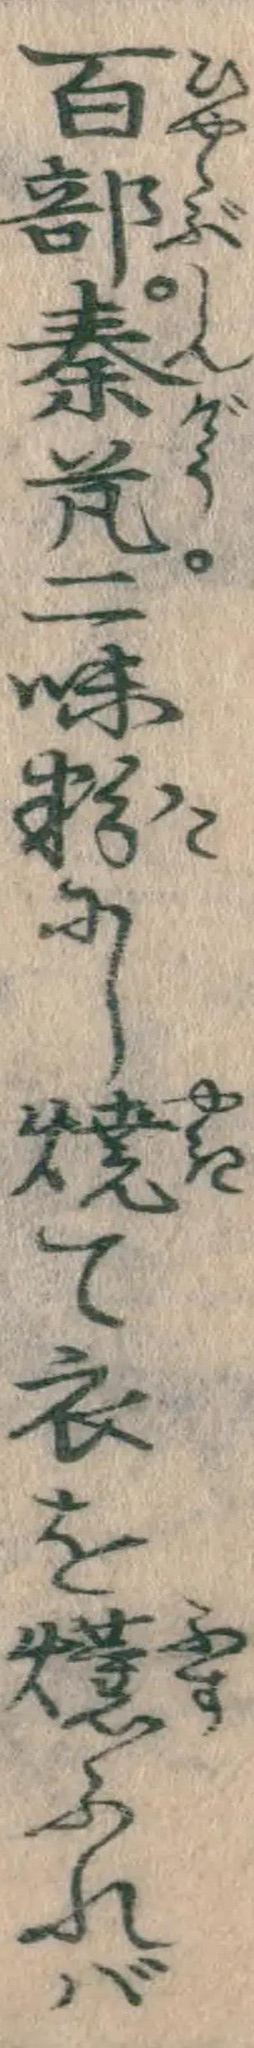百部。秦艽。二味粉にし焼て衣を燻ふれば
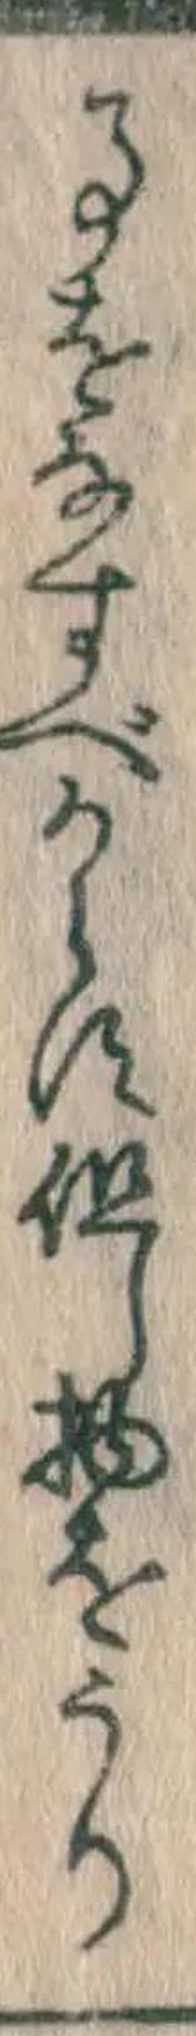事をなすべからす但し物をうり
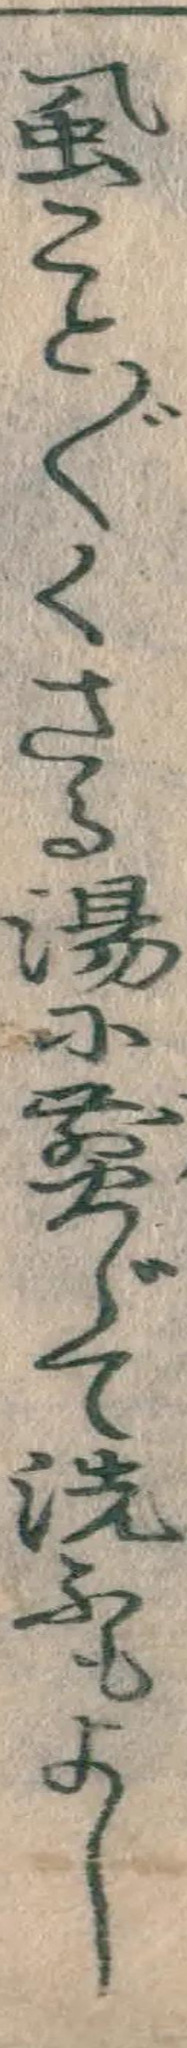蝨こと〴〵くさる湯に煎じて洗ふもよし
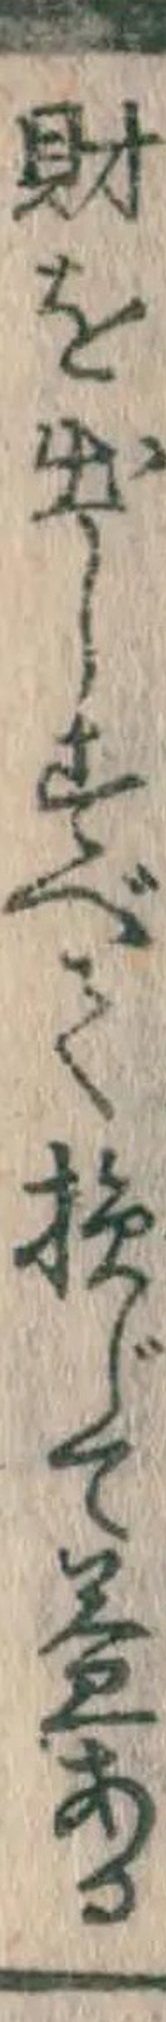財を出しすべて損じて益ある
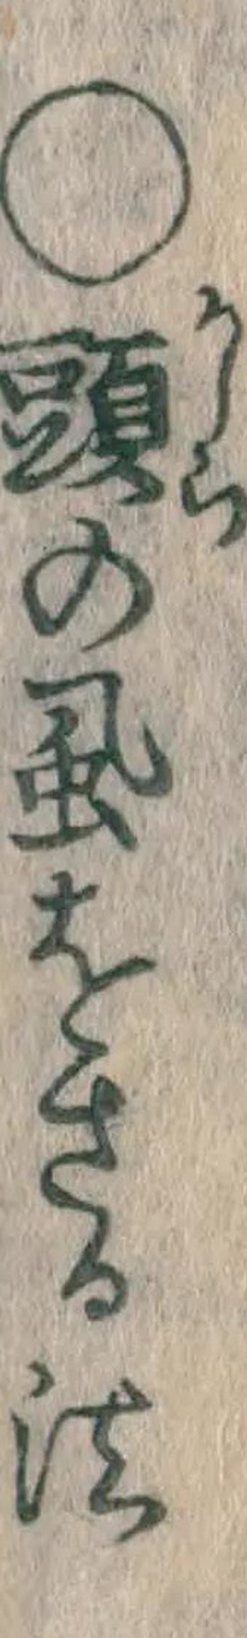○頭の蝨をさる法
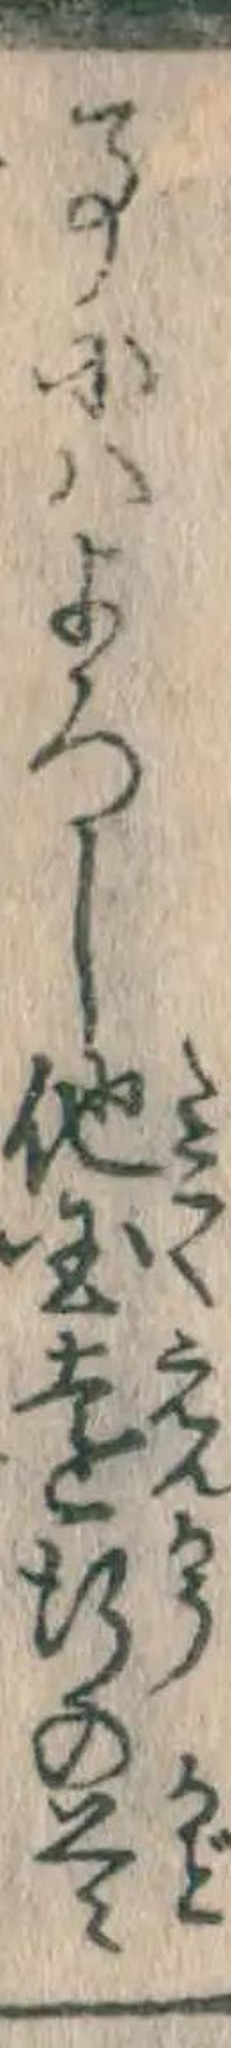事にはよろし他国遠行の首
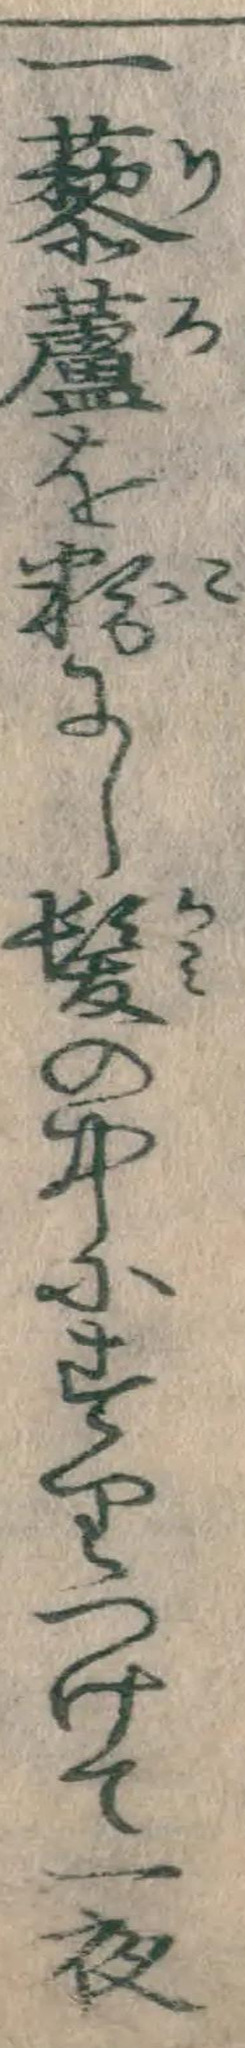一藜蘆を粉にし髪の中にすりつけて一夜
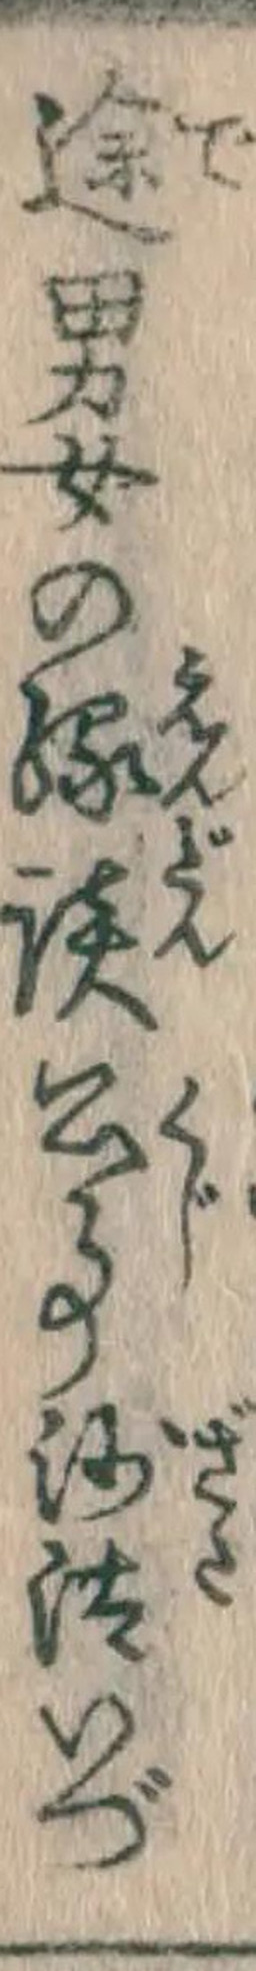途男女の縁談公事沙汰いづ
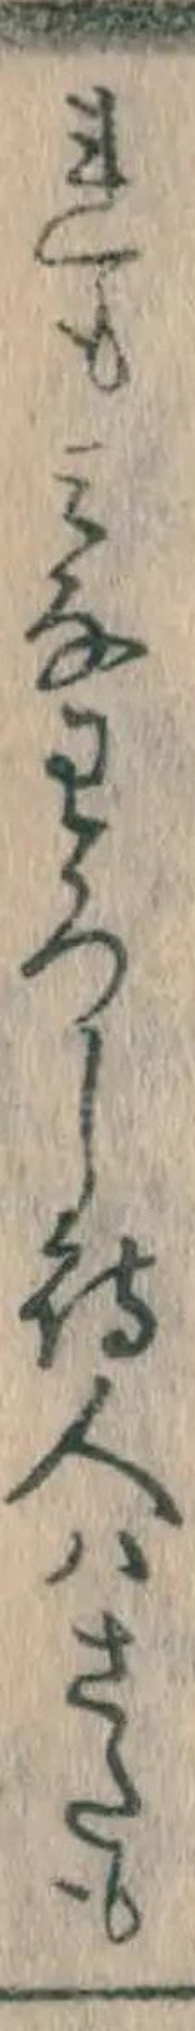れもみなわろし待人はさたも
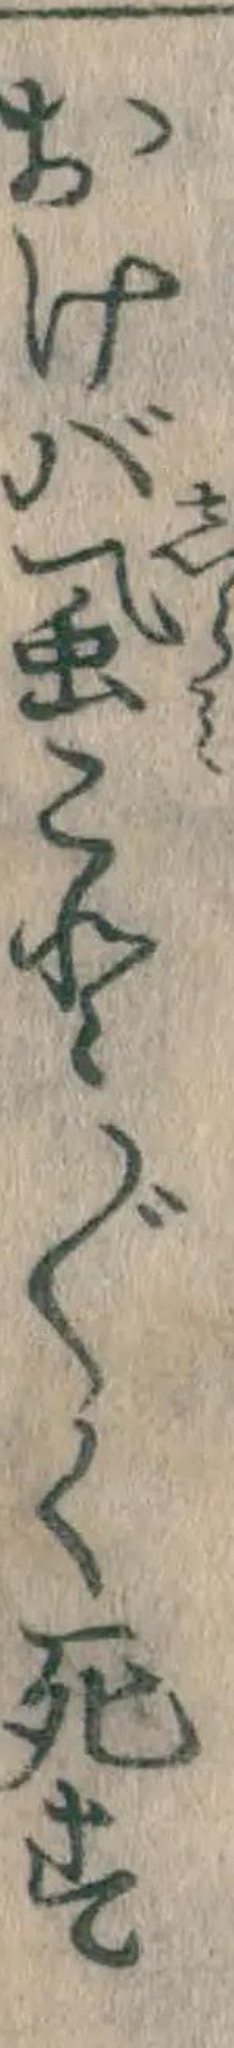おけば蝨こと〴〵く死す

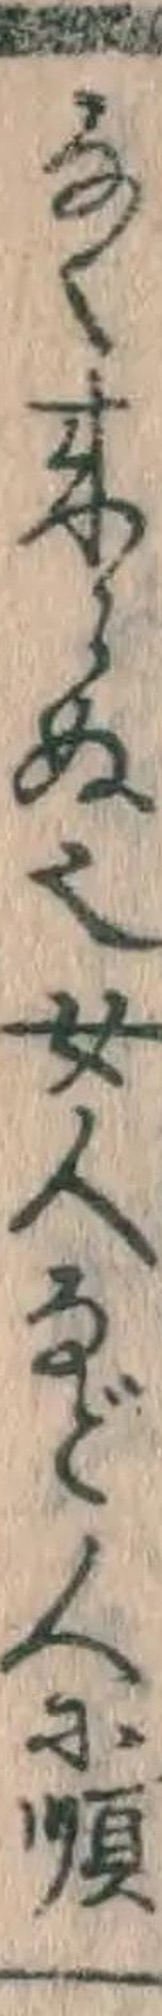なく来らぬ也女人など人に順
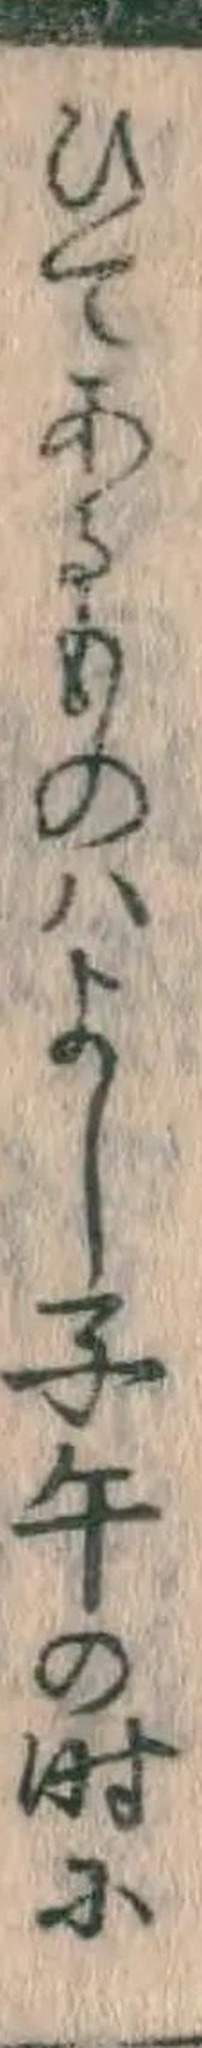ひてあるものはよし子午の時に
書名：広益秘事大全 3巻. [2]
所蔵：国立国会図書館 National Diet Library, JAPAN
